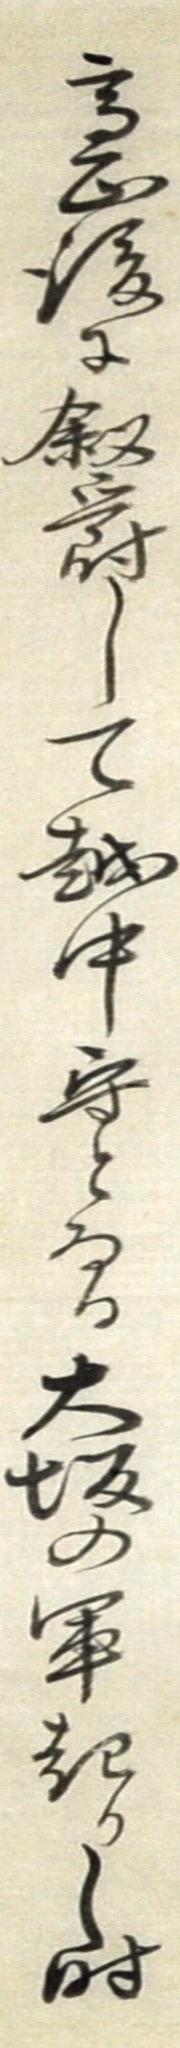高正後に叙爵して越中守となる大坂の軍起りし時
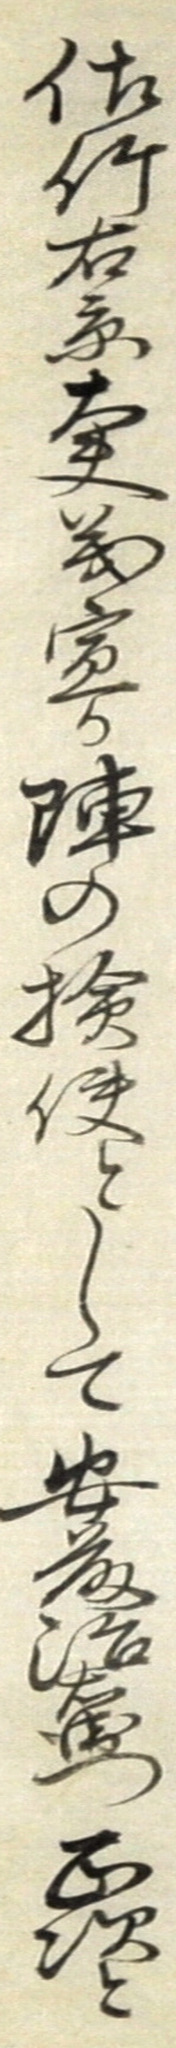佐竹右京大夫義宣か陣の撿使として安藤治右衛門正次と
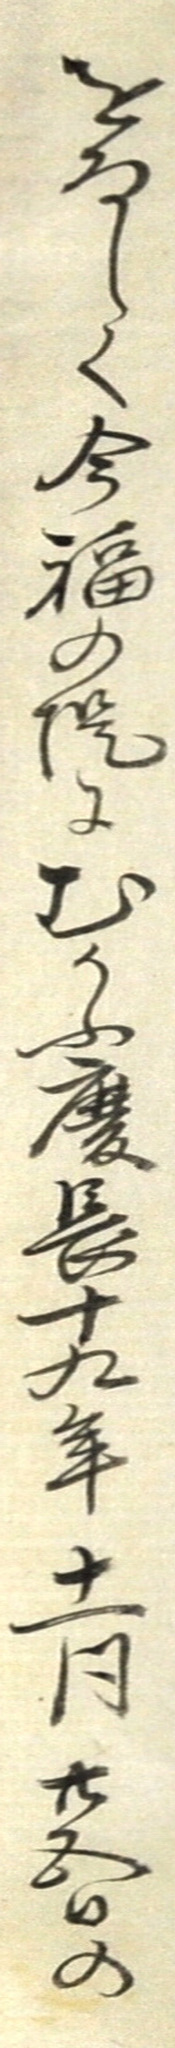をなしく今福の堤にむかふ慶長十九年十一月廿五日の

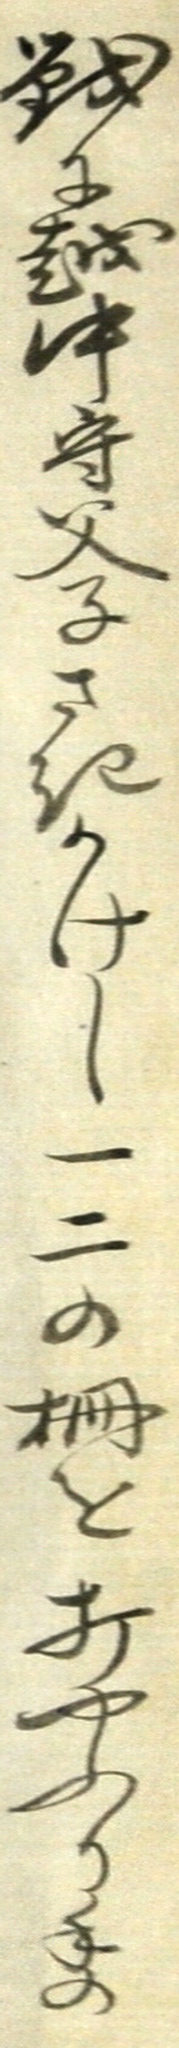戦に越中守父子さきかけし一二の柵を打やふり手の
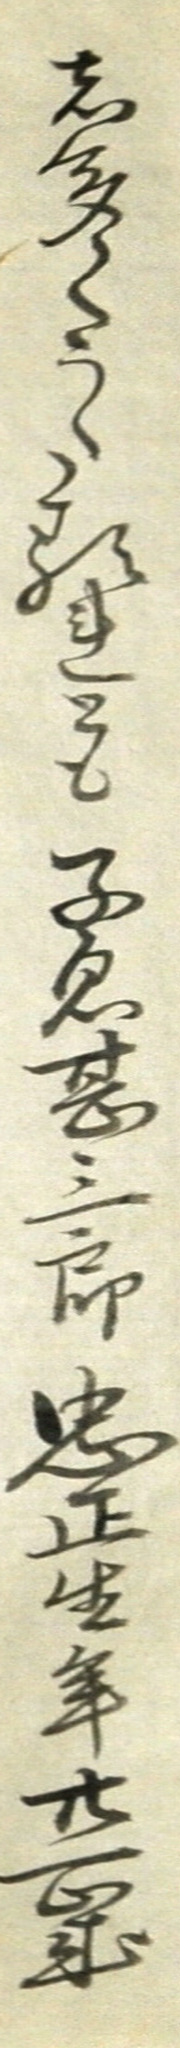者多くうたるれとも子息甚三郎忠正生年廿一歳
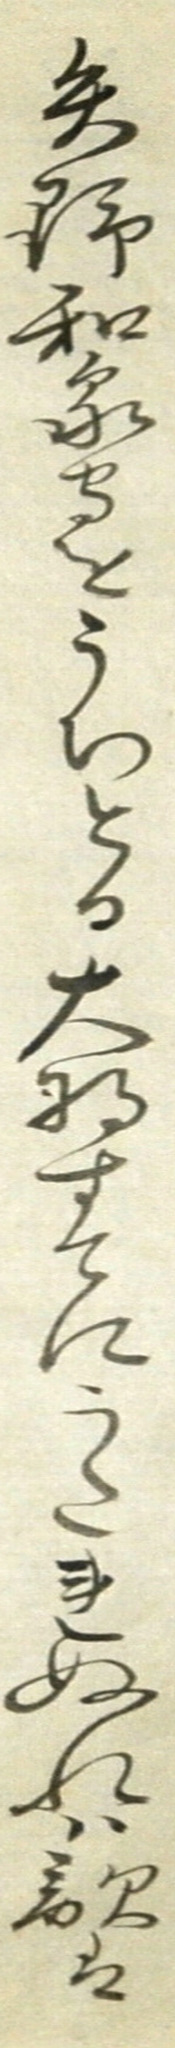矢野和泉守をうちとる大将すてにうたれぬれは敵は
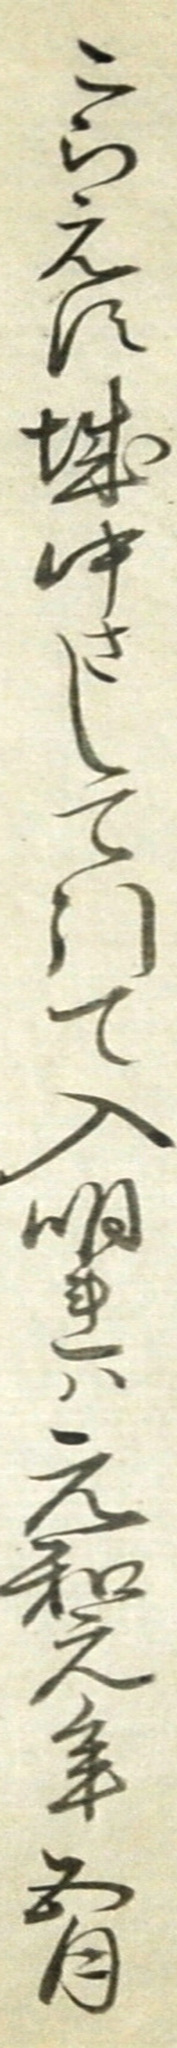こらえす城中さして引て入明れは元和元年五月
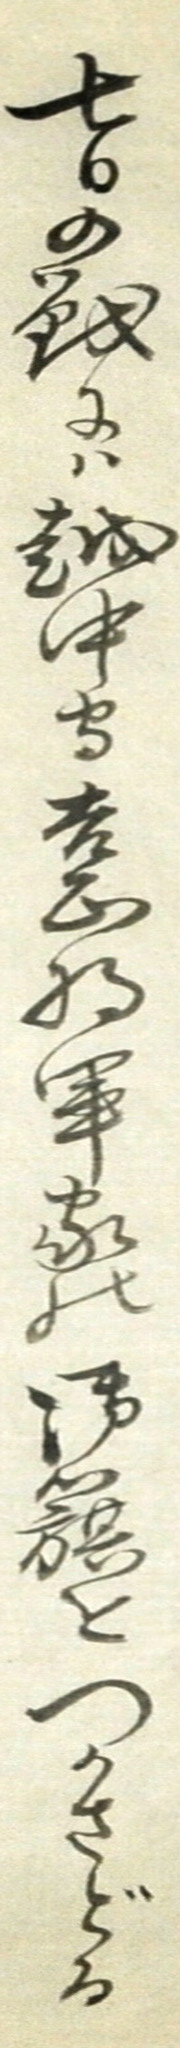七日の戦には越中守吉正将軍家の御旗をつかさどる
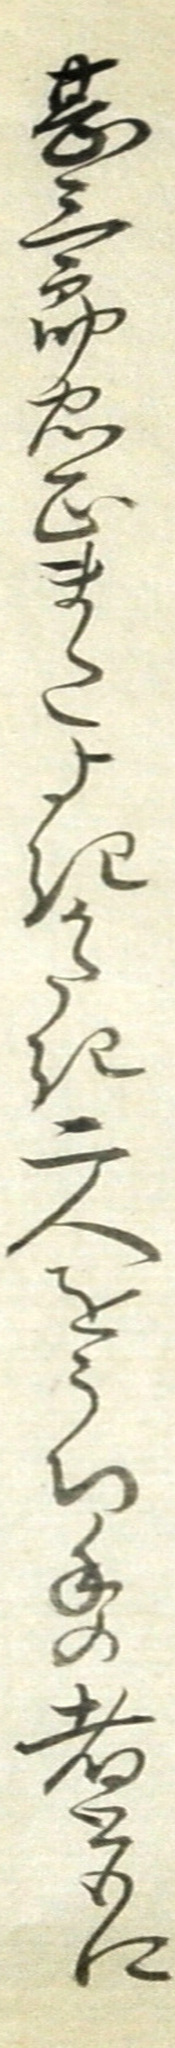甚三郎忠正またよきかたき二人をうち手の者ともに
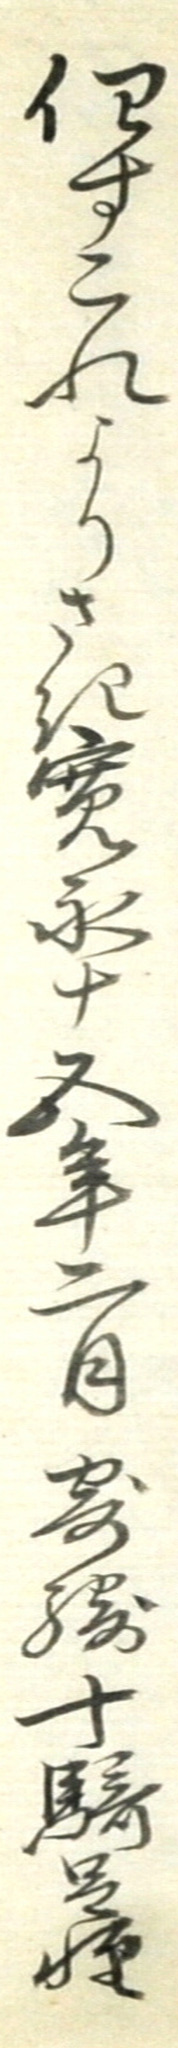任すこれよりさき寛永十五年二月寄騎十騎足軽
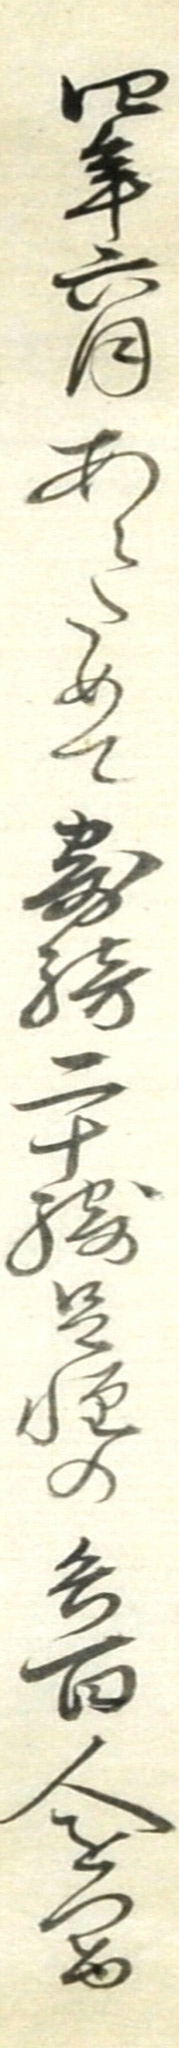四年六月あらためて寄騎二十騎足軽の兵百人をつけ
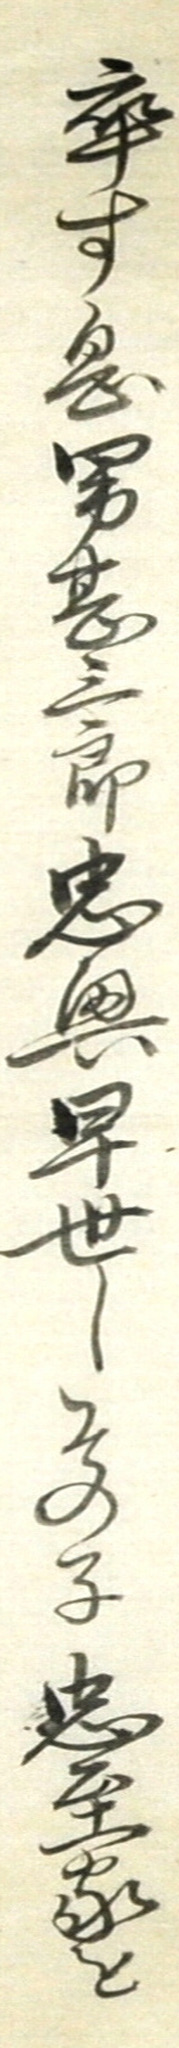卒す息男甚三郎忠興早世しその子忠至家を
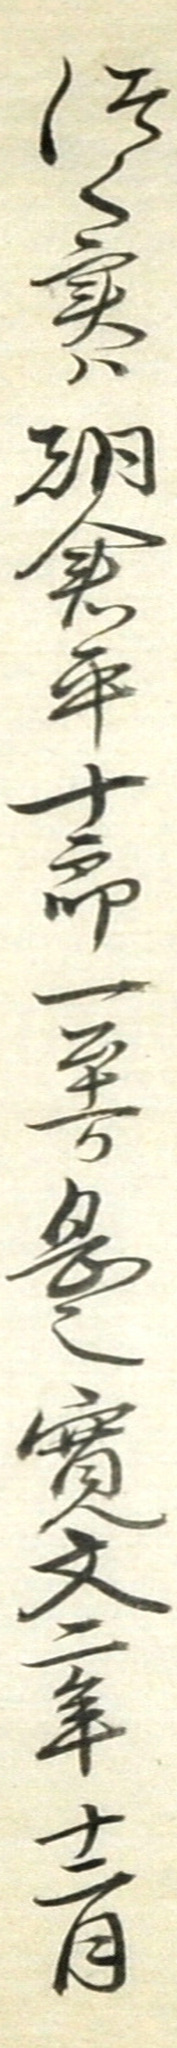つく実は朝倉平十郎一至か息也寛文二年十二月

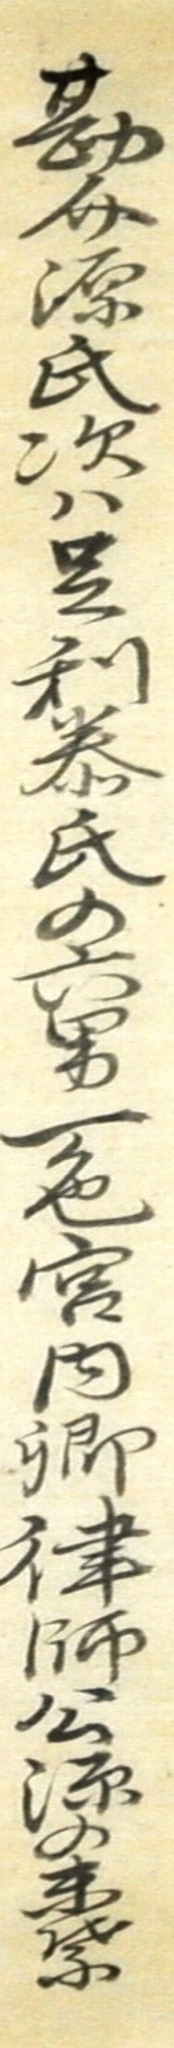勘介源氏次は足利泰氏の六男一色宮内卿律師公深の末葉
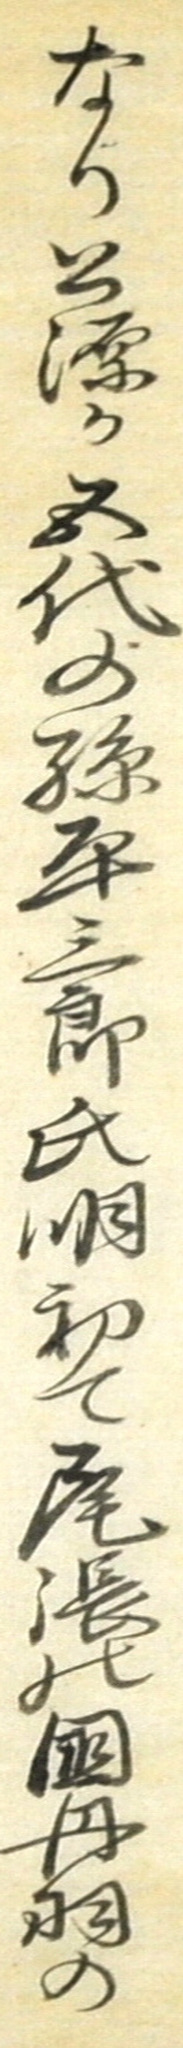なり公深か五代の孫平三郎氏明初て尾張の国丹羽の
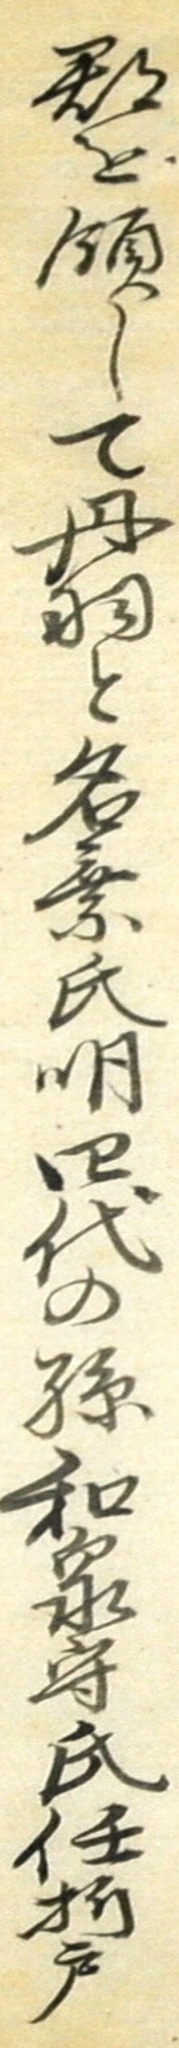郡を領して丹羽と名乗氏明四代の孫和泉守氏任折戸
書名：藩翰譜（六）
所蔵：伊那市立高遠町図書館・合同会社AMANE
